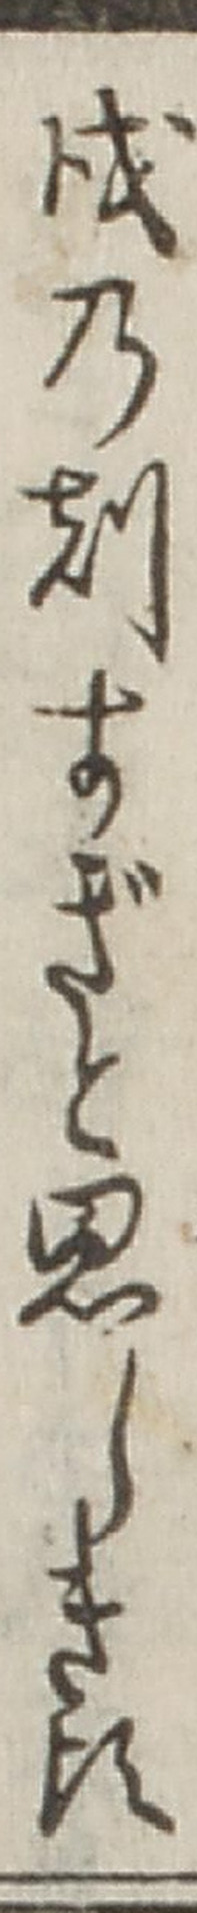戌の刻すぎと思しき頃
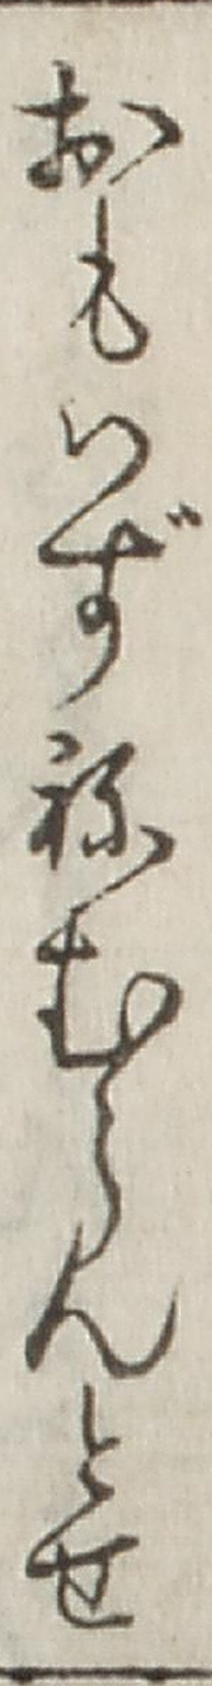おもはず祢むらんとせ
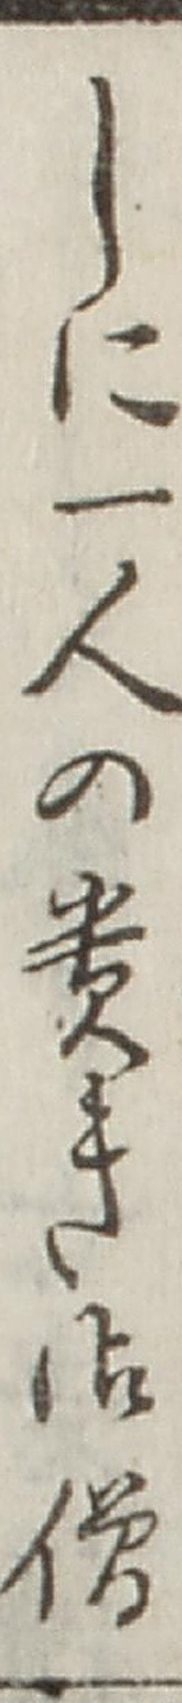しに一人の貴き御僧
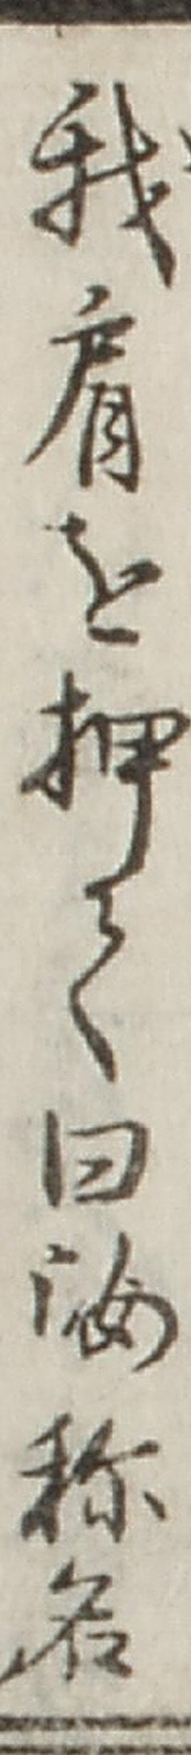我肩を押て曰汝称名
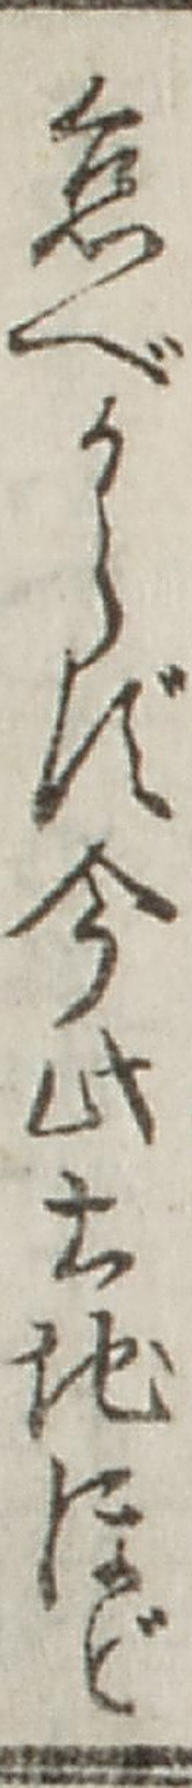怠べからず今此大地ほど
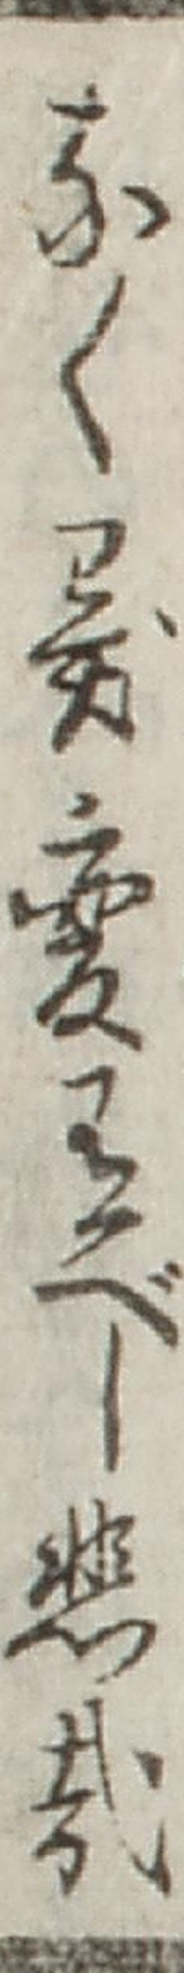なく異変有べし悲哉

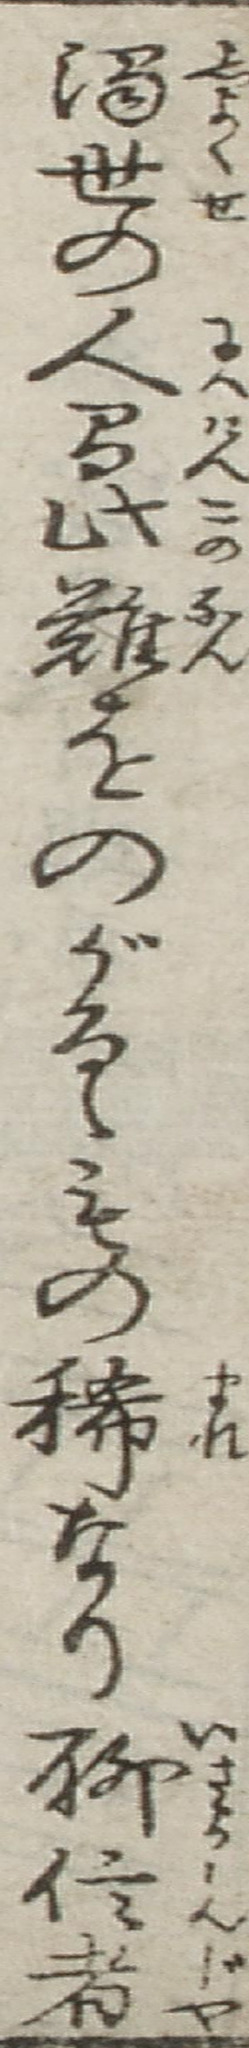濁世の人間此難をのがるゝもの稀なり聊信者
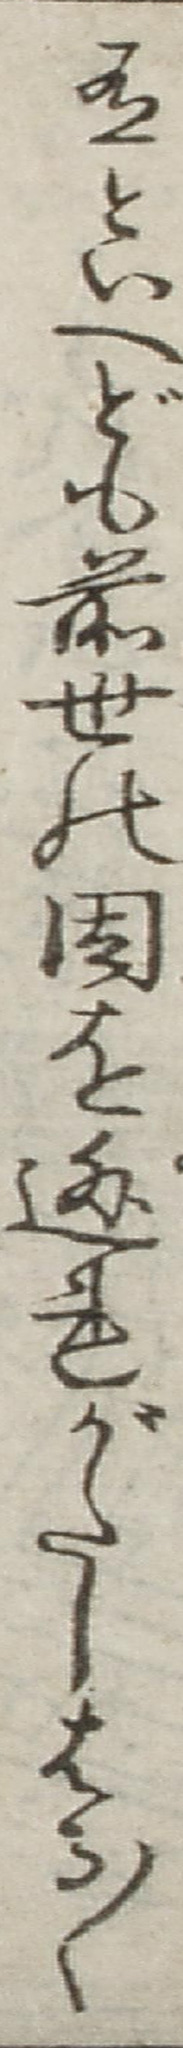有といへども前世の因を逃れがたしはる〳〵
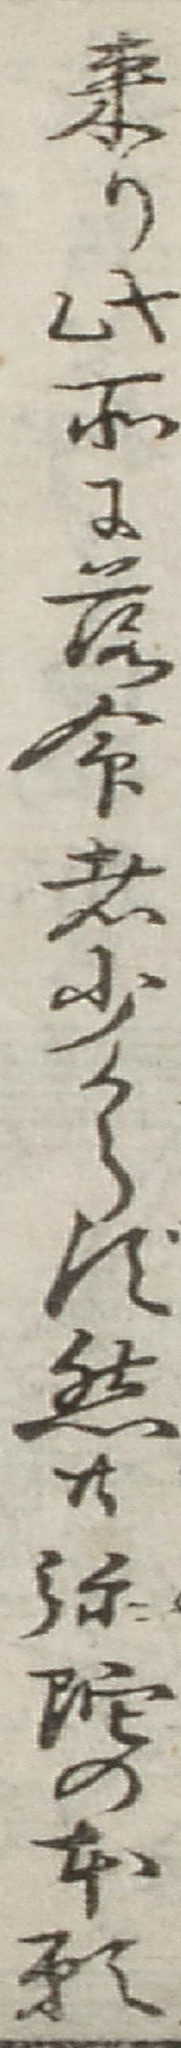来り此所に落命者少からず然共弥陀の本願
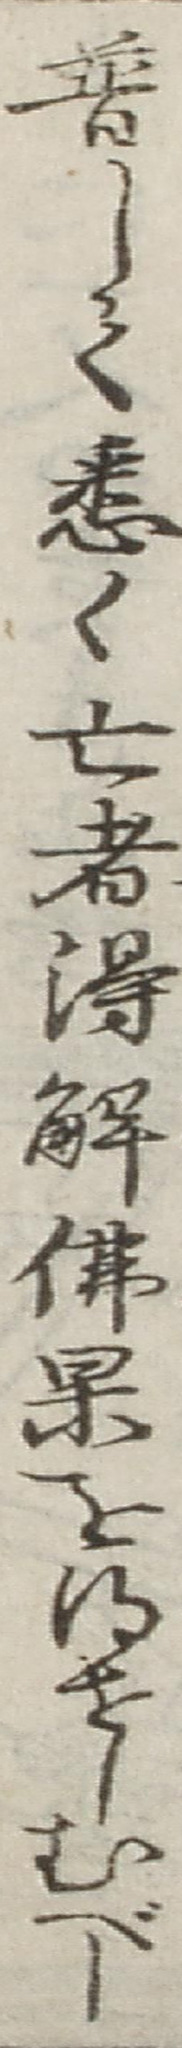普して悉く亡者得解仏果を得せしむべし
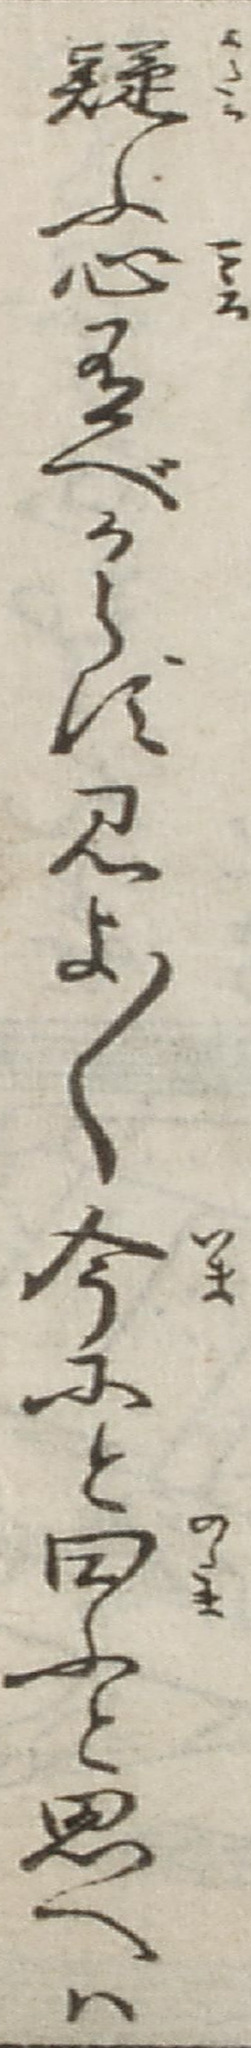疑ふ心有べからず見よ〳〵今にと曰ふと思へハ
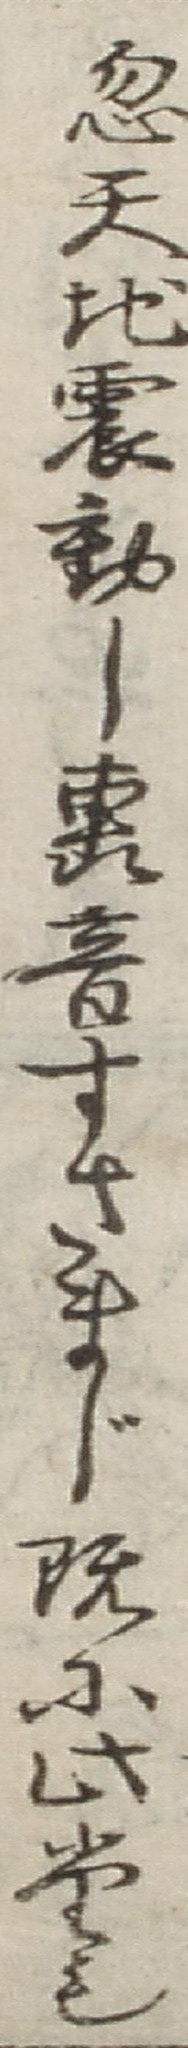忽天地震動し轟音すさまじ既に此堂も
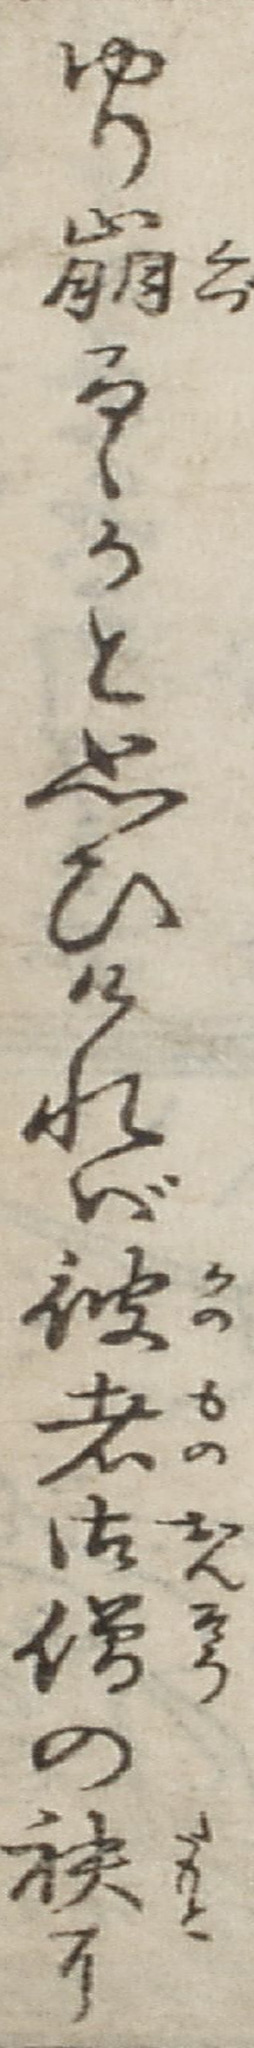ゆり崩るゝかと思ひければ彼者御僧の袂に
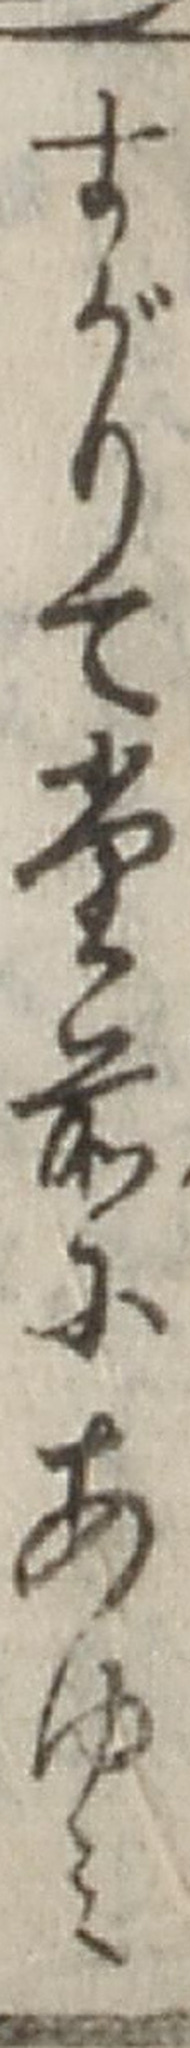すがりて堂前にあゆミ
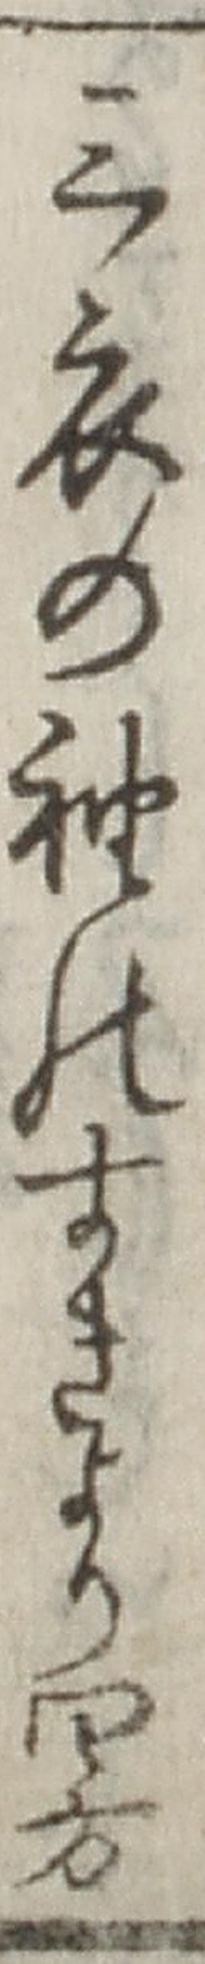三衣の袖のすきより四方
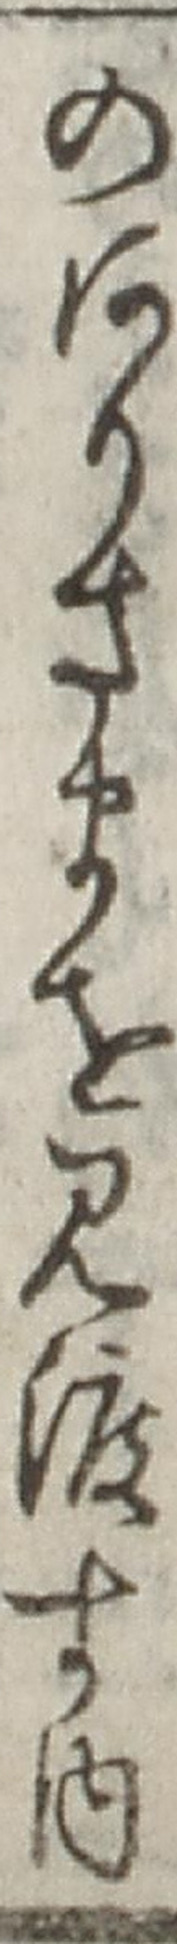のありさまを見渡す内
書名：地震世直草紙　全
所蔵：東京大学地震研究所図書室 Earthquake Research Institute Library, The University of Tokyo, JAPAN
